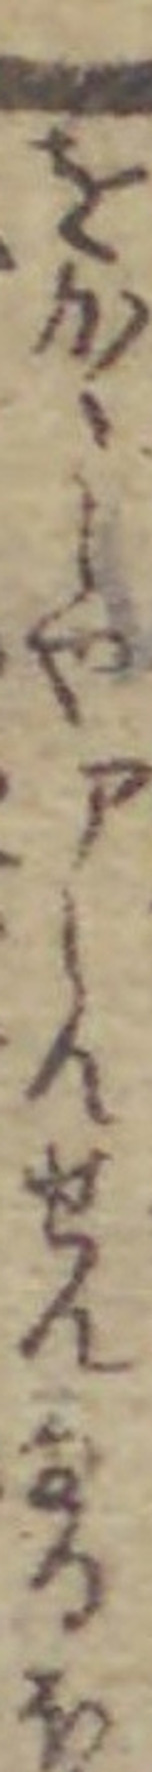をかくしやアしんせんなるほと
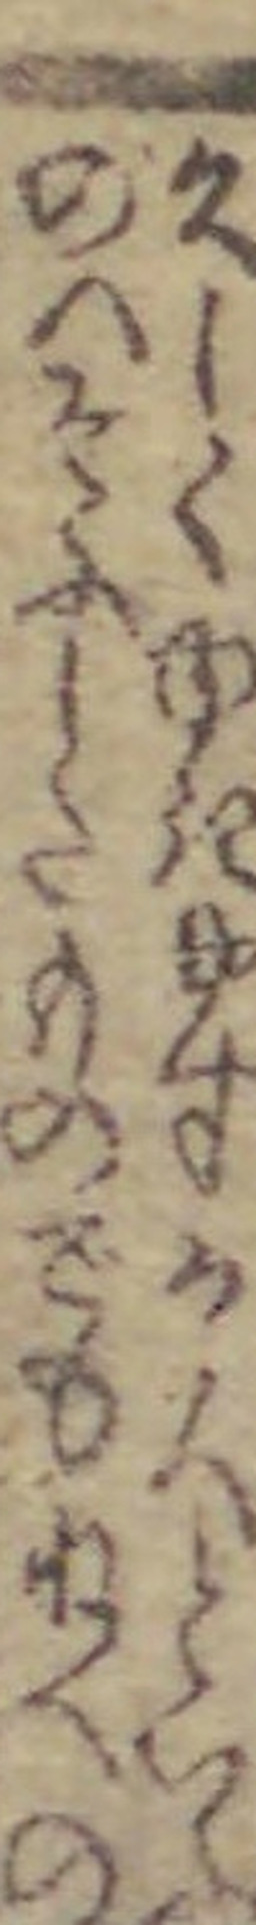のはそふしたものでもねへのさ
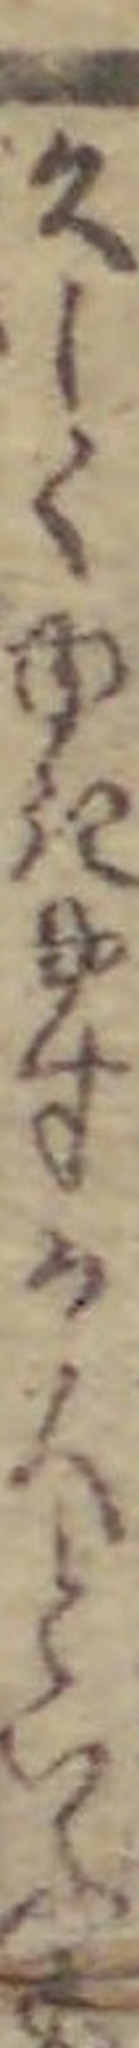久しくゆきやすか人といふも
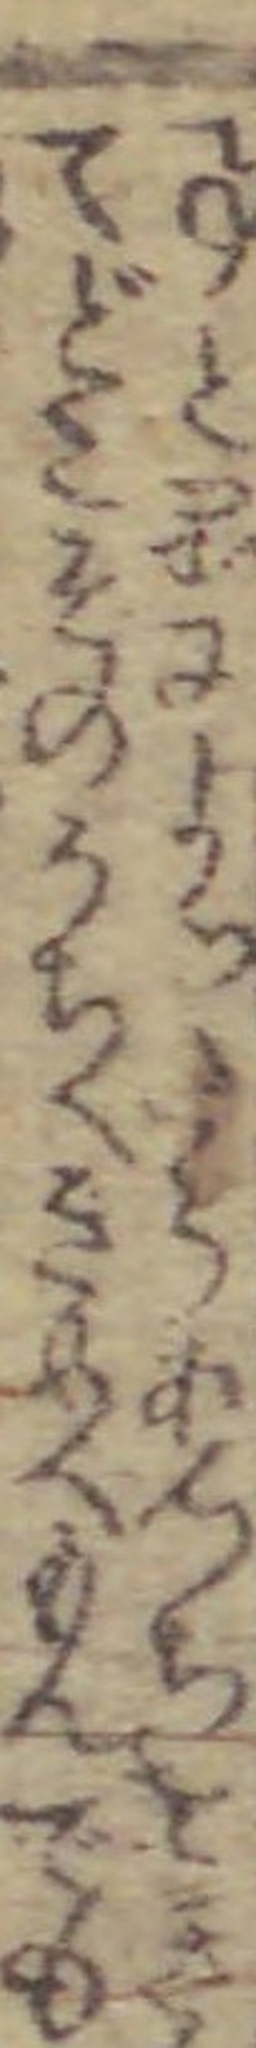てどこそのうちへきめへもんでも
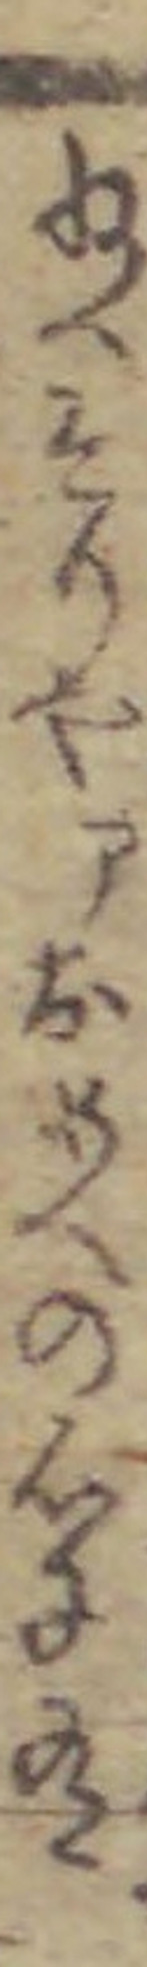ねへそりやアおめへの心に有
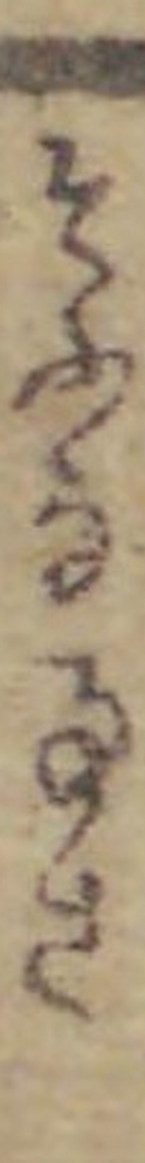そふな事さ
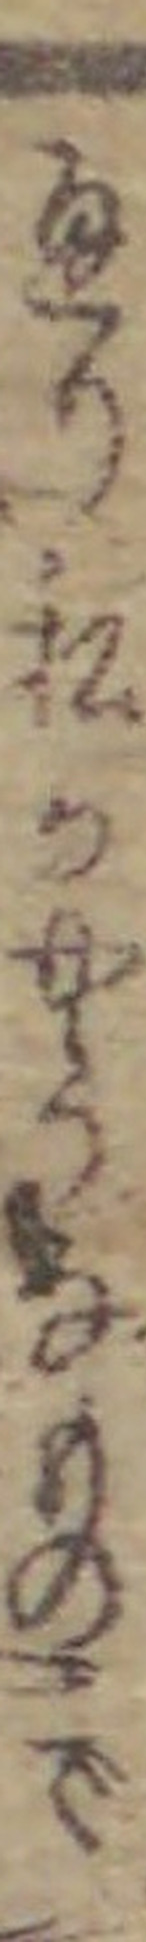通り私かやうなもので
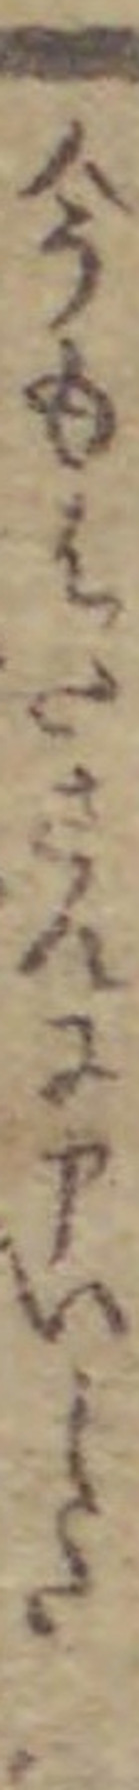今もはたさんに申いした
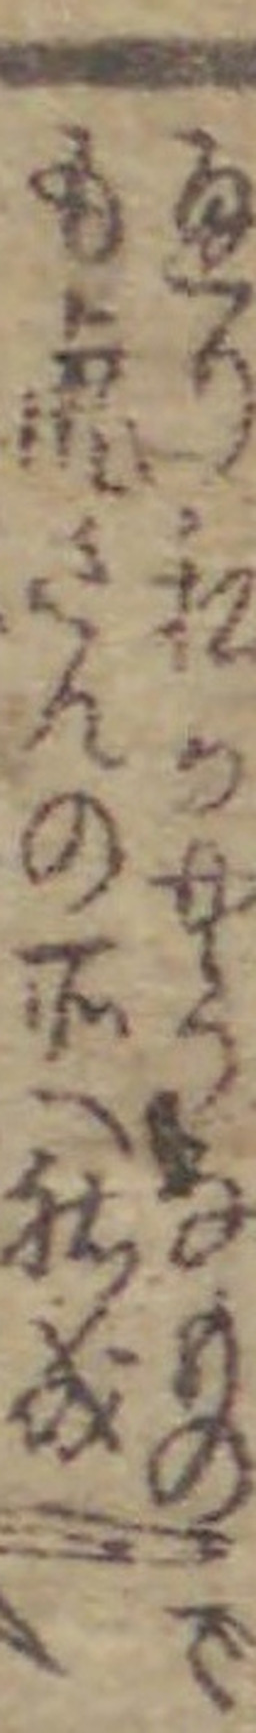も虎さんの所へ祐成
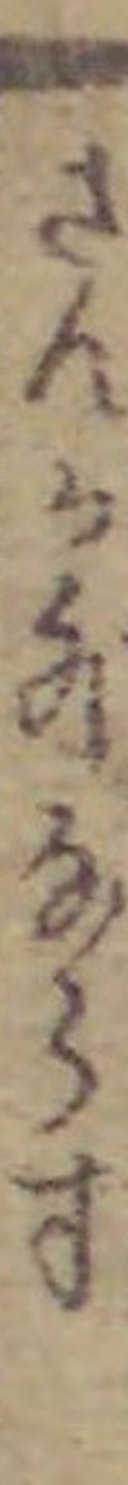さんか外ならす

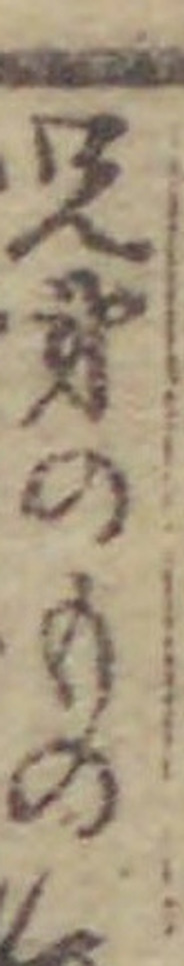兄弟のもの
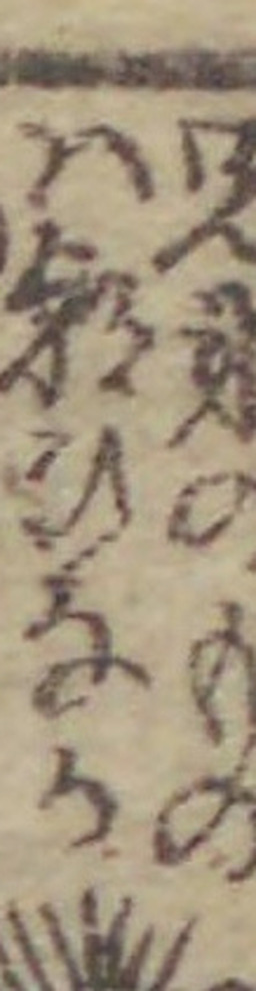は朝ひなか
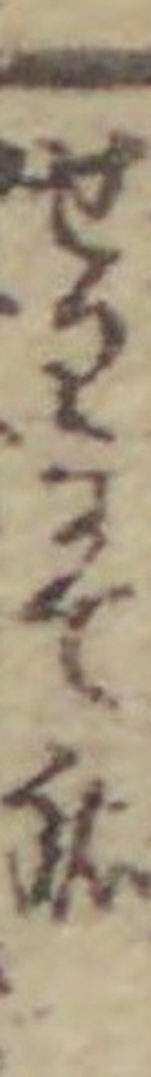せわにて祐
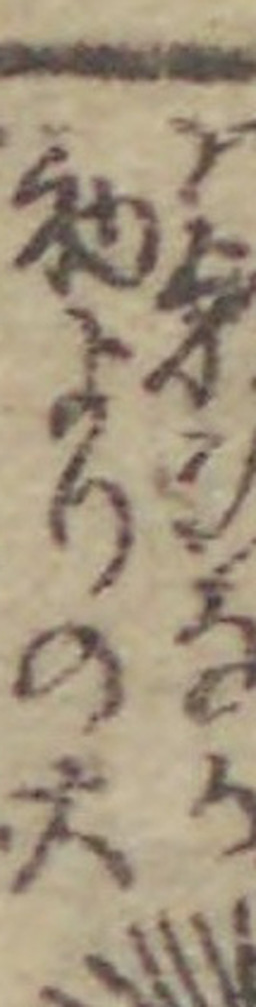初よりの大
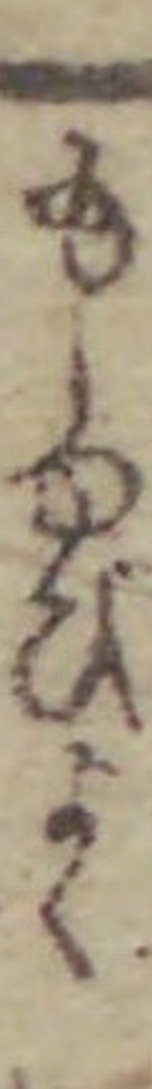もしゆびよく
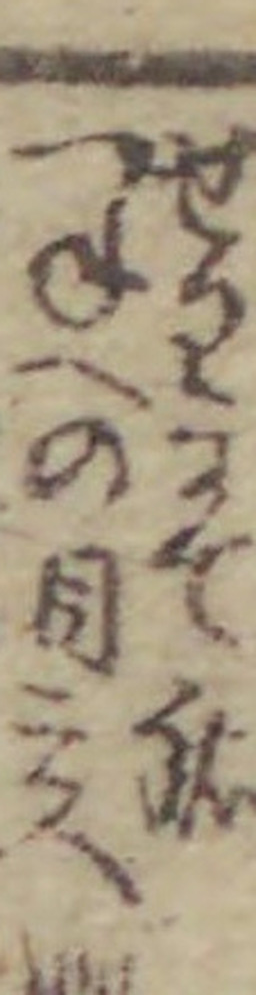つねへの目みへ
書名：間似合嘘言曽我 3巻
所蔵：国立国会図書館 National Diet Library, JAPAN
